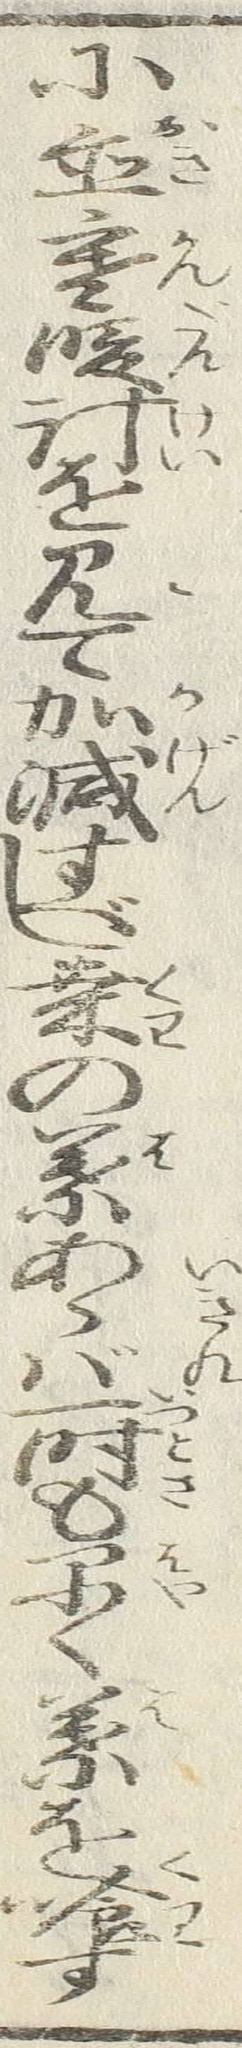に置寒暖計を見て加減すべし桑の葉あらば一時も早く葉を喰す
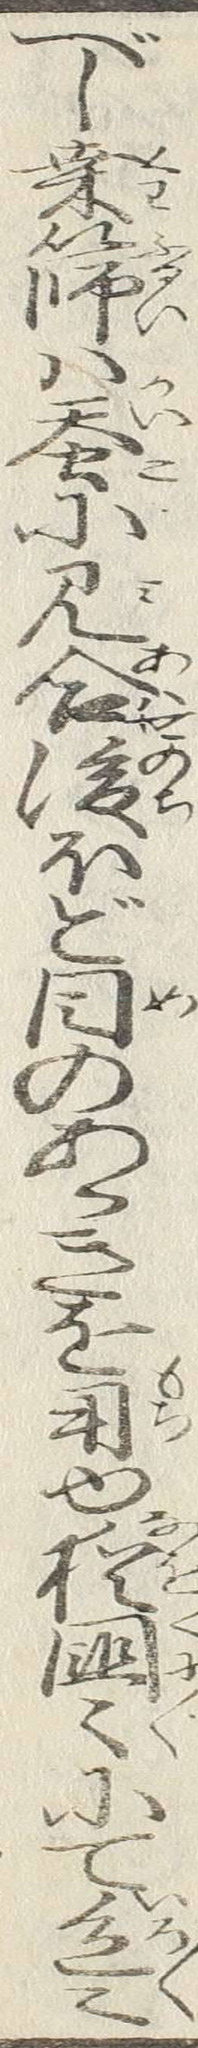べし桑篩は蚕に見合後ほど目のあらきを用ゆ猶國々にて色々
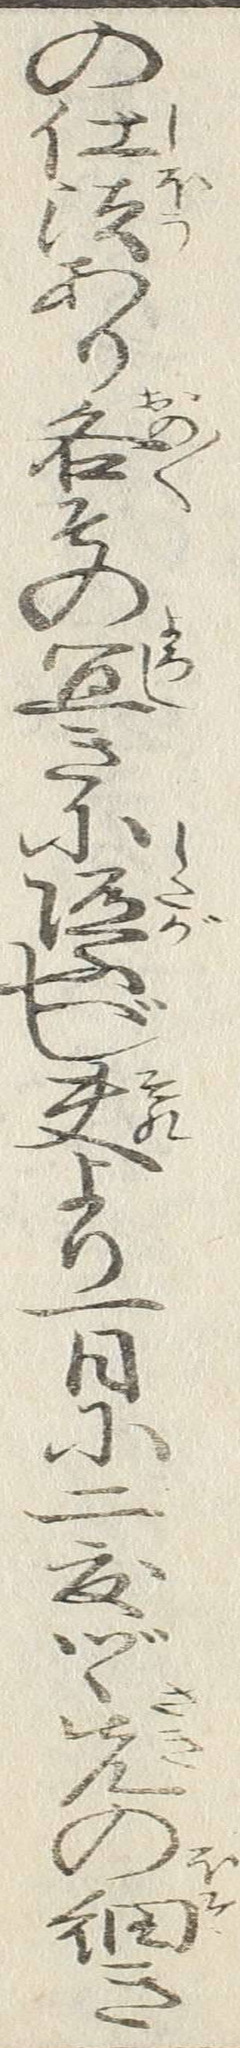の仕法あり各その宜きに随ふべし夫より一日に二度ヅヽ先の細き
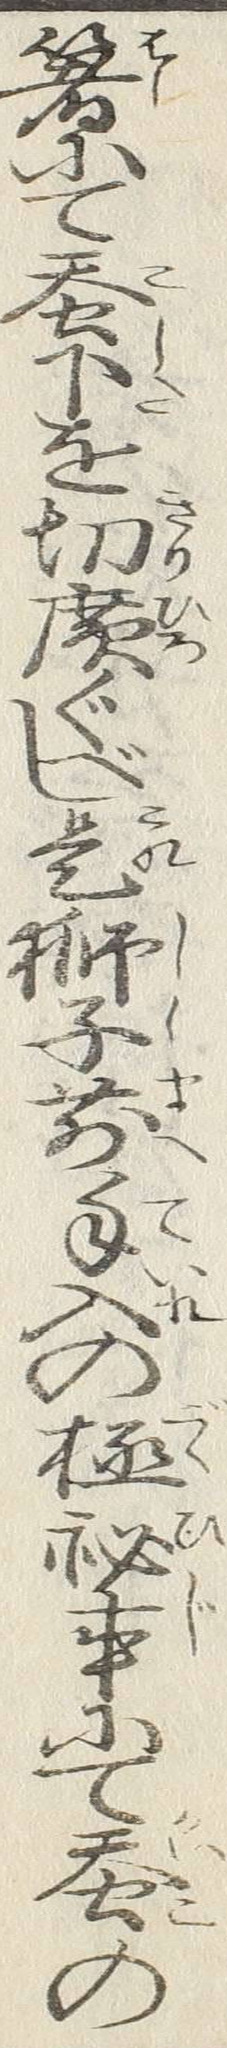箸にて蚕下を切廣ぐべし是獅子前手入の極秘事にて蚕の
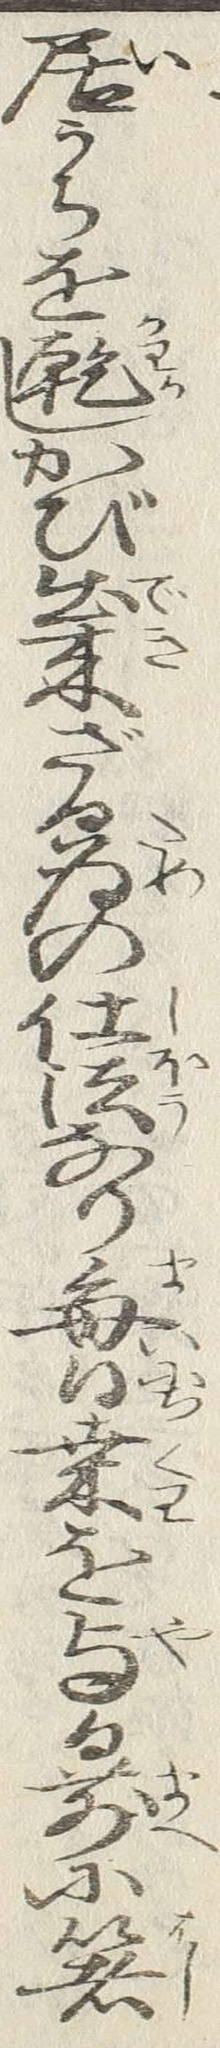居うらを乾しかび出来ざる為の仕法なり毎日桑を与る前に箸
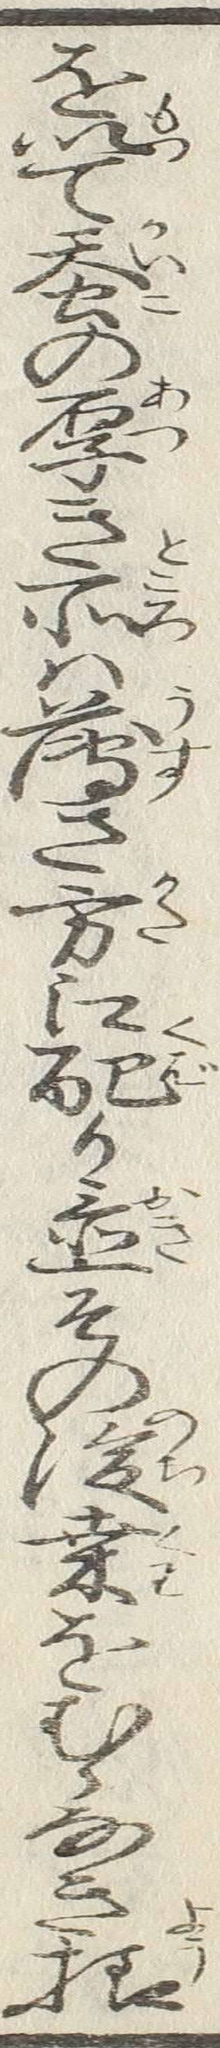を以て蚕の厚き所は薄き方え配り置その後桑をむらなき様
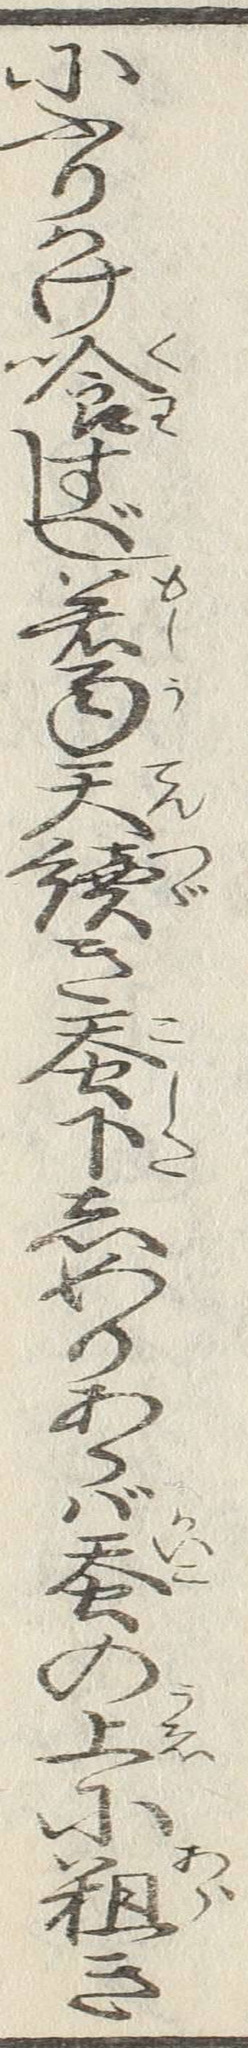にふりかけ喰すべし若雨天續き蚕下しめりあらば蚕の上に粗き
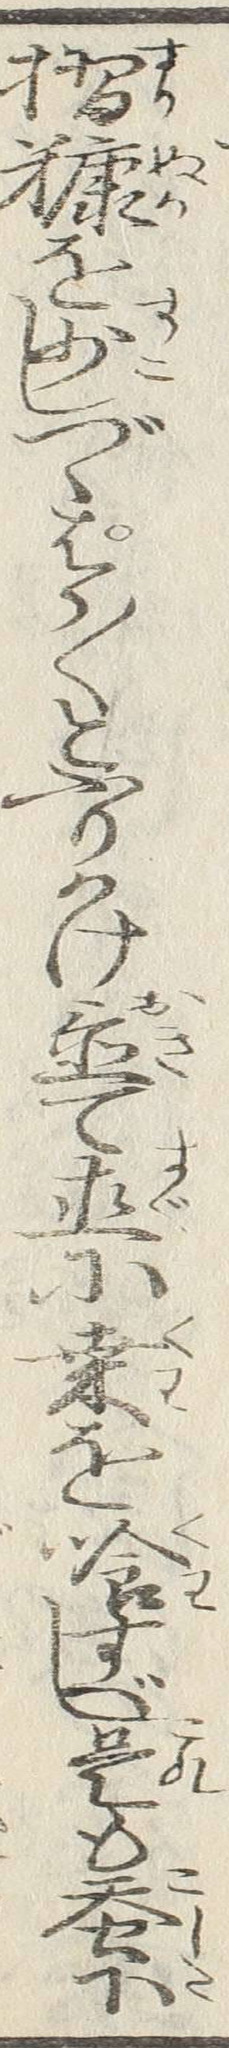摺糠を少しづゝぱら〳〵とふりかけ置て直に桑を喰すべし是も蚕下
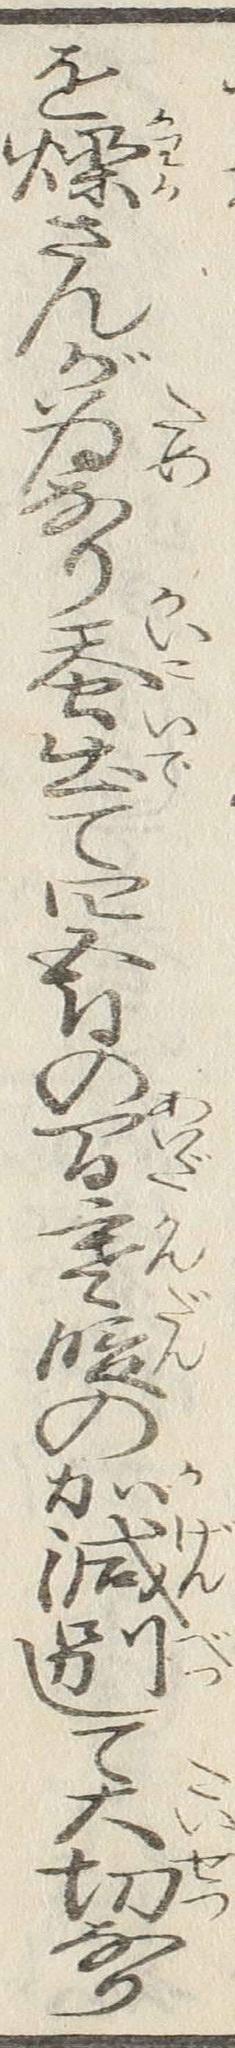を燥さんが為なり蚕出て四五日の間寒暖の加減別して大切なり
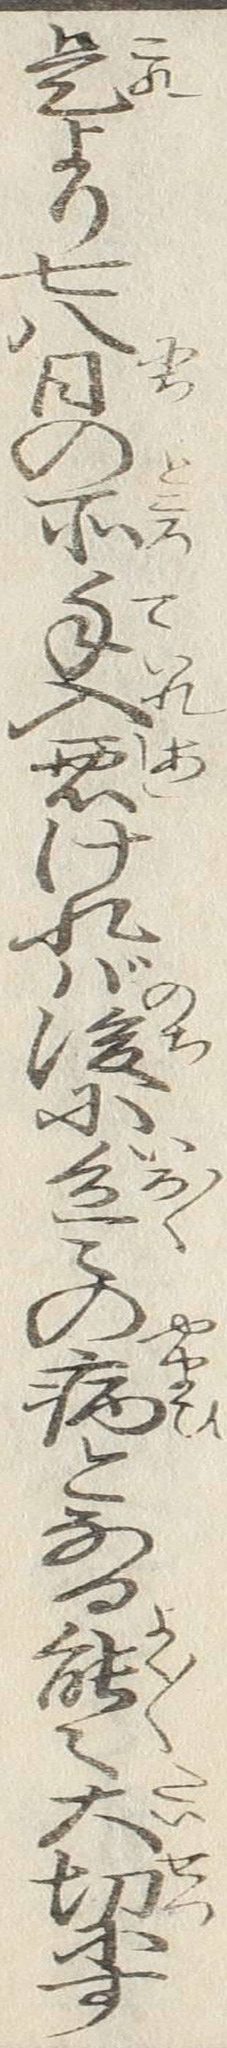是より七八日の所手入悪ければ後に色々の病となる能々大切にす

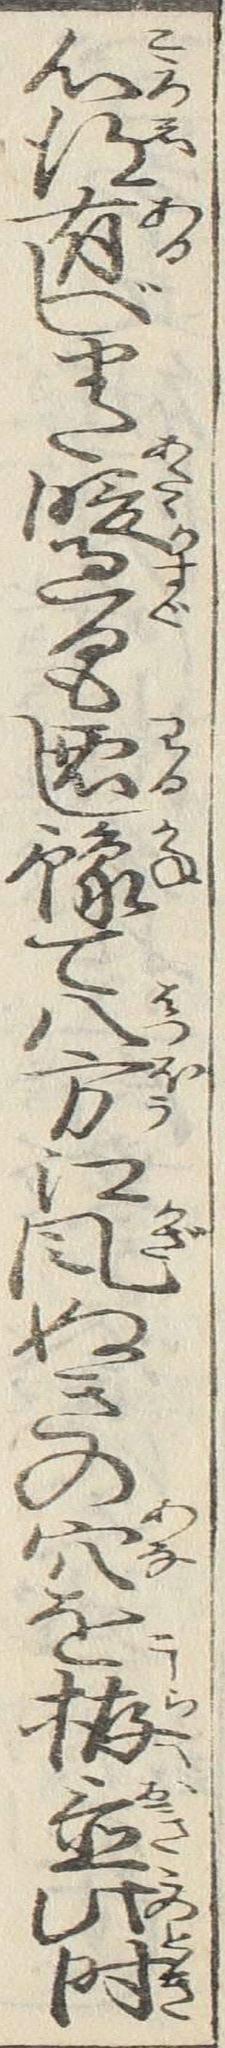心得有べしまた暖過るも悪し豫て八方え風ぬきの穴を拵置此時
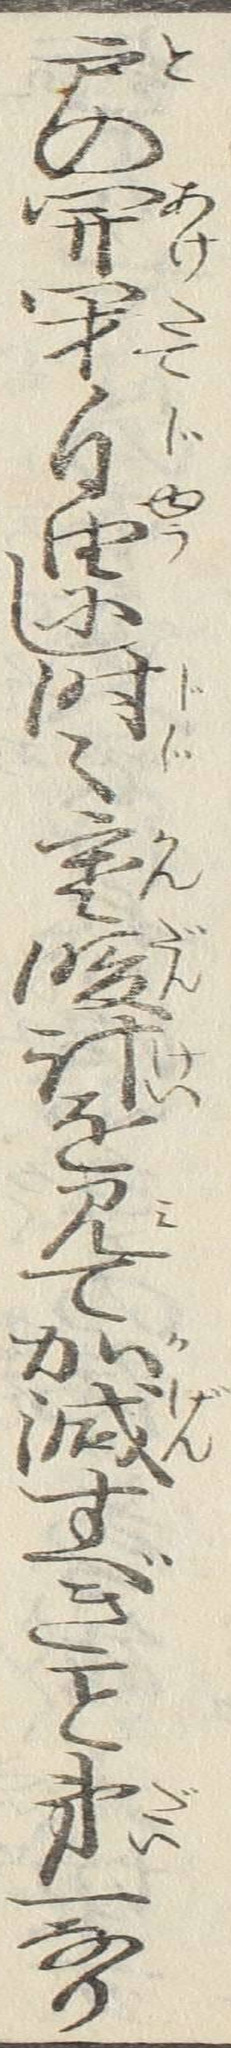戸の開閉自由にし時々寒暖計を見て加減すべきこと第一なり
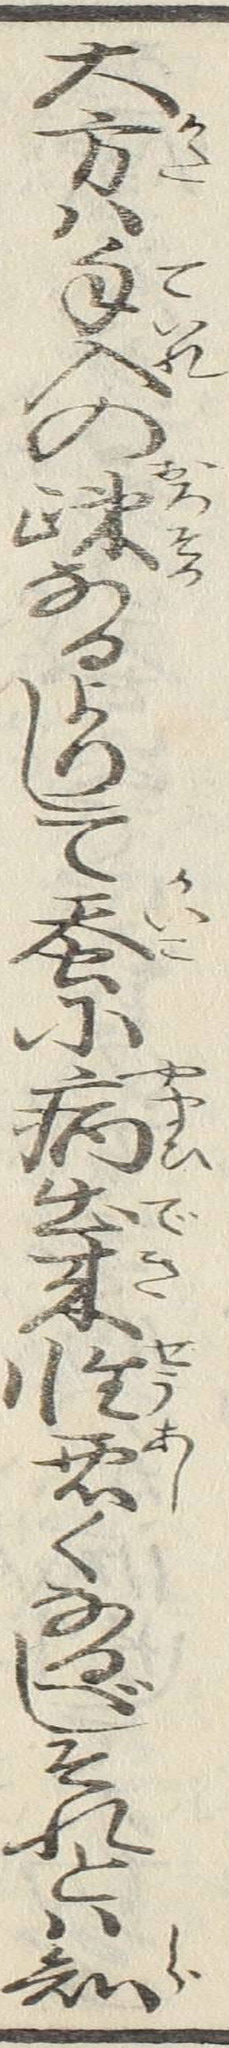大方は手入の疎なるよりして蚕に病出来性悪くなるべしそれとは知
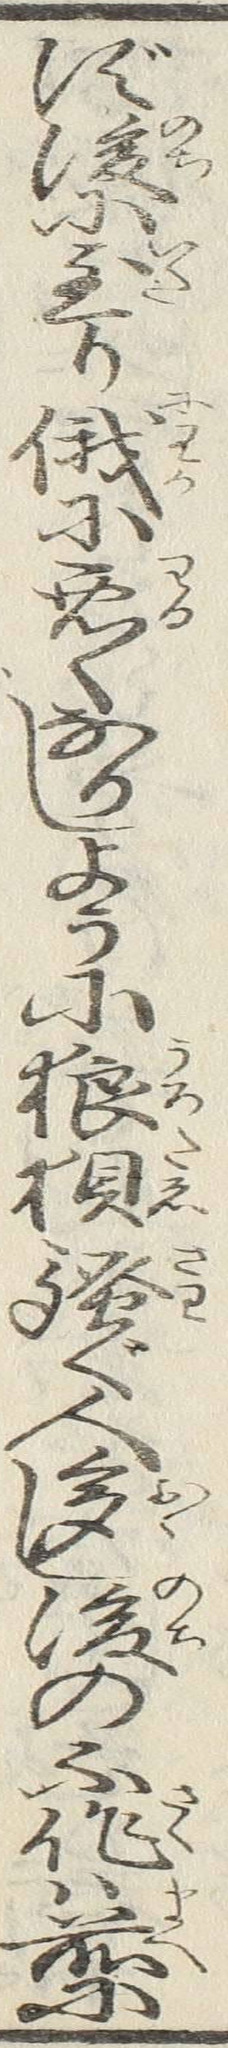ず後に至り俄に悪くなりしように狼狽騒ぐ人多し後のふ作は前に
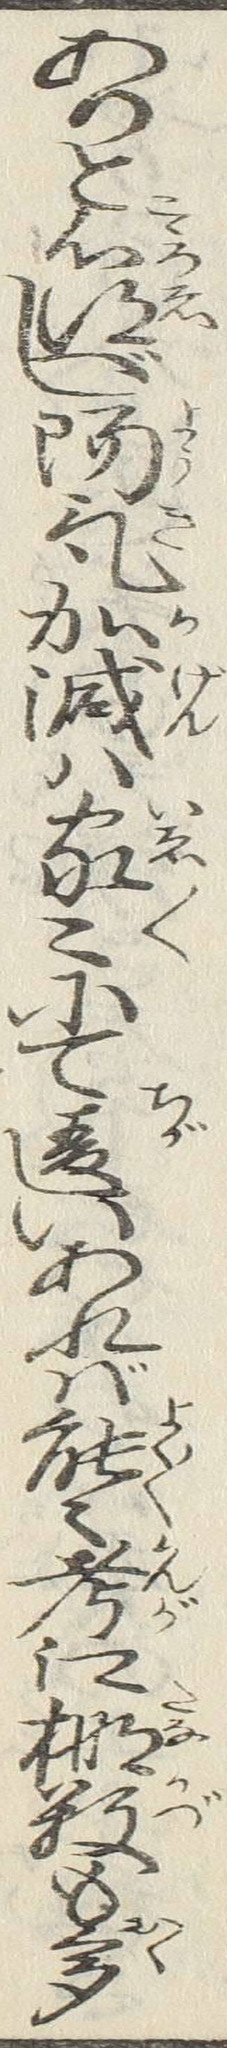ありと心得べし陽気加減は家々にて違いあれば能々考え棚数も多
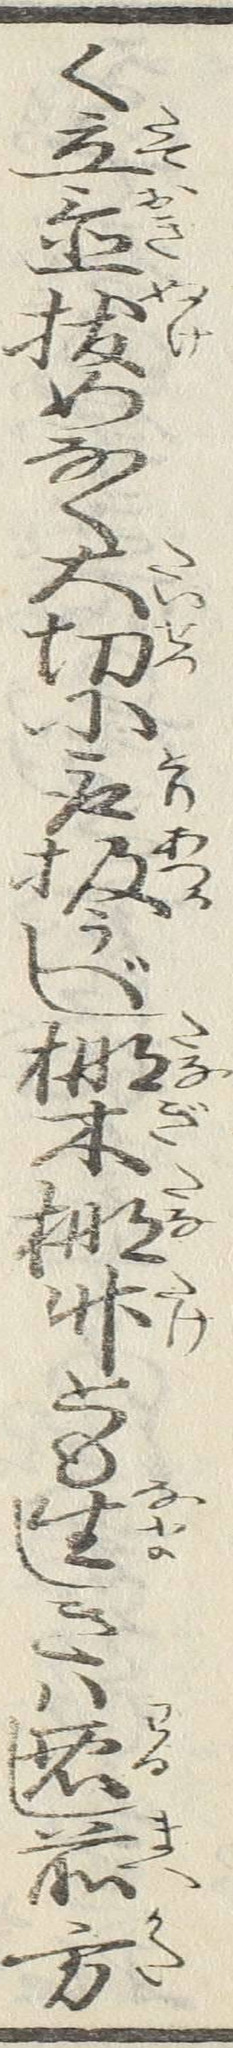く立置抜めなく大切に取扱うべし棚木棚竹とも生しきは悪し前方
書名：養蠶實驗録
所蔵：東京大学農学生命科学図書館 国文学研究資料館
